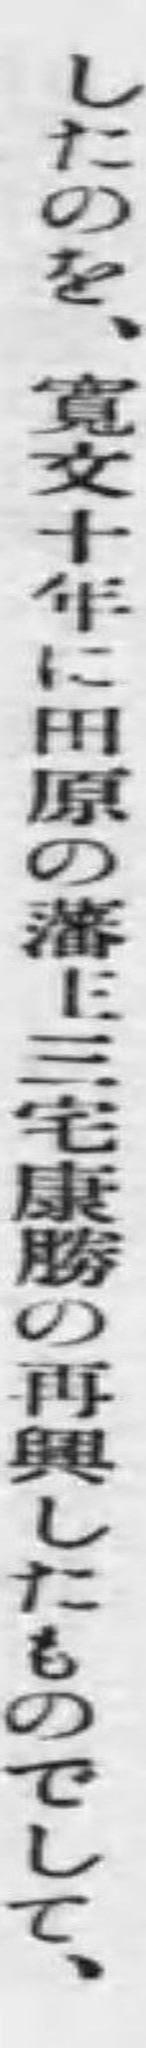したのを、寛文十年に田原の藩主三宅康勝の再興したものでして、
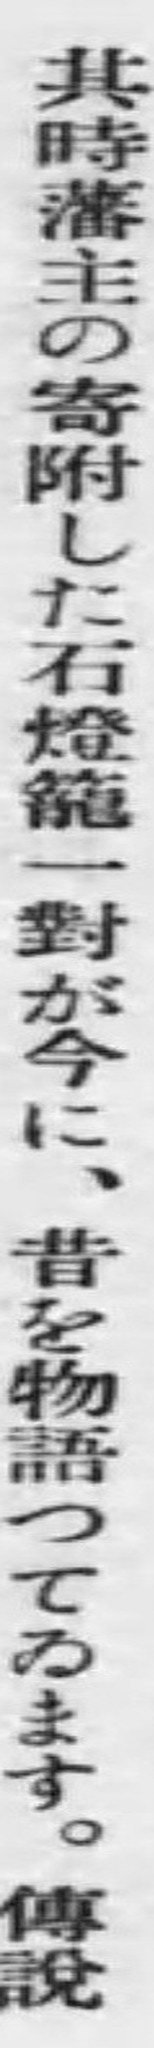其時藩主の寄附した石灯籠一対が今に、昔を物語つてゐます。伝説
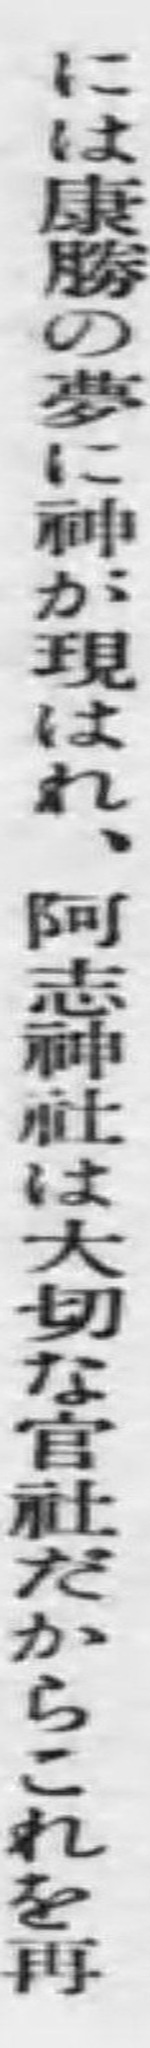には康勝の夢に神が現はれ、阿志神杜は大切な官社だからこれを再
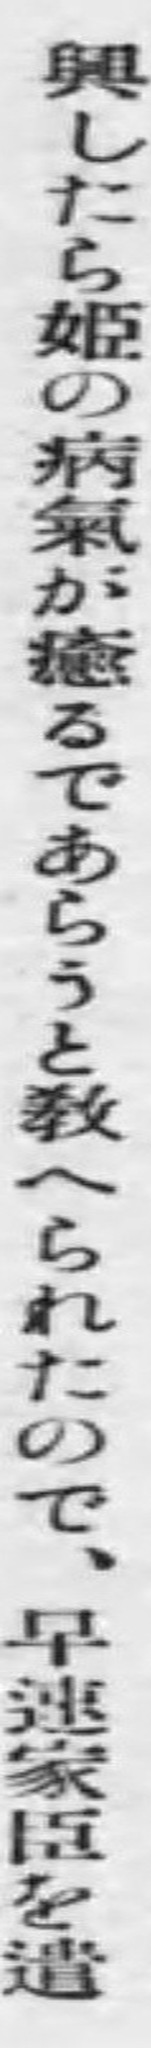興したら姫の病気が癒るであらうと教へられたので、早速家臣を遣
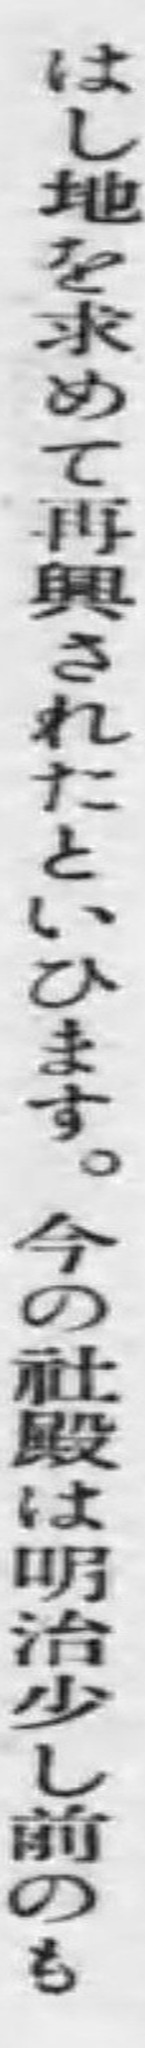はし地を求めて再興されたといひます。今の社殿は明治少し前のも
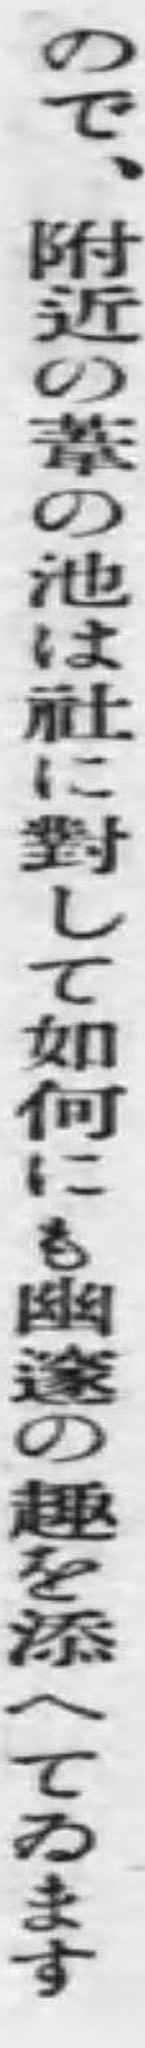ので、附近の葦の池は社に対して如何にも幽邃の趣を添へてゐます
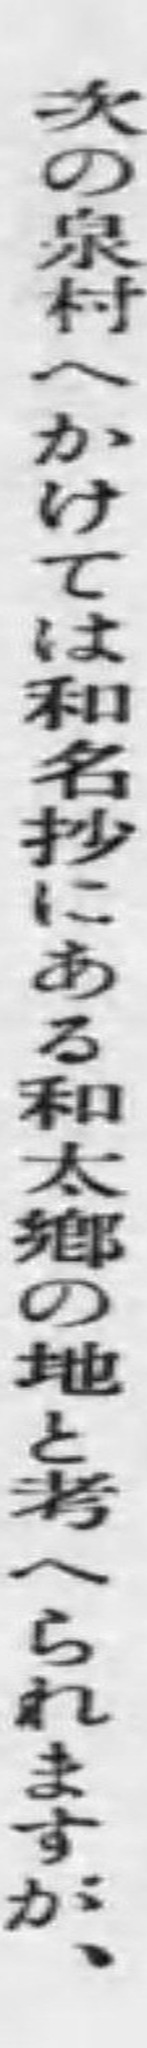次の泉村へかけては和名抄にある和太郷の地と考へられますが、
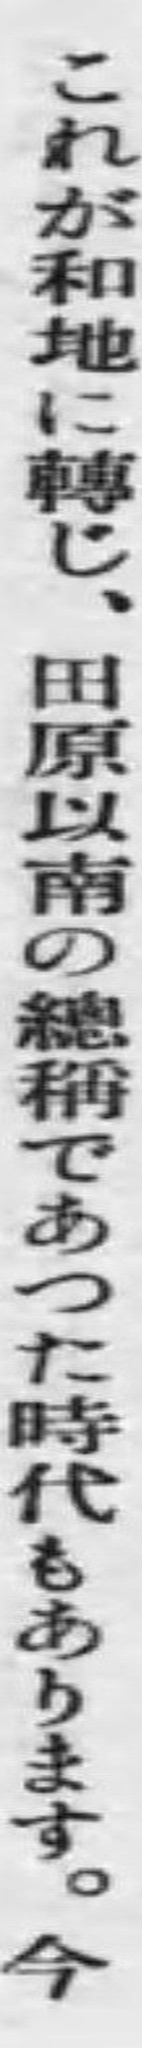これが和地に転じ、田原以南の総称であつた時代もあります。今
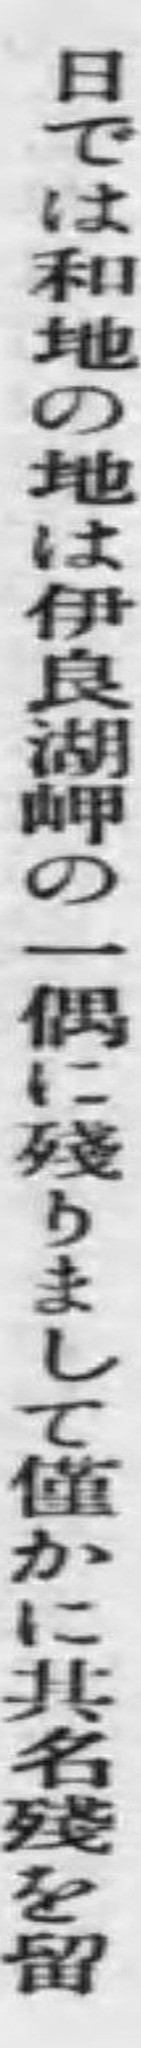日では和地の地は伊良湖岬の一偶に残りまして僅かに其名残を留
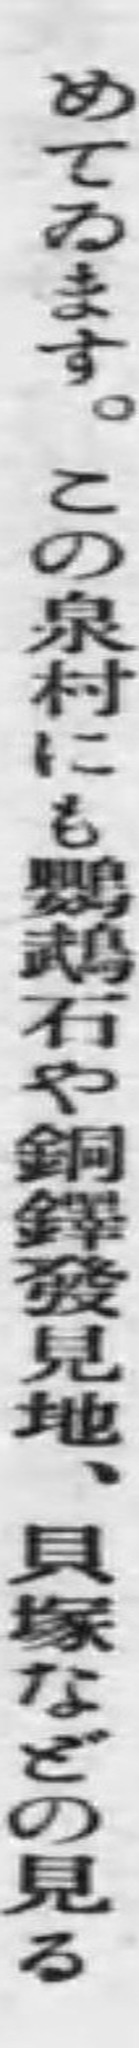めてゐます。この泉村にも鸚鵡石や銅鐸発見地、貝塚などの見る
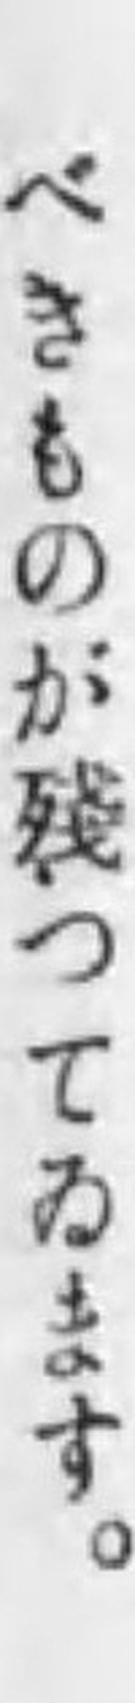べきものが残つてゐます。
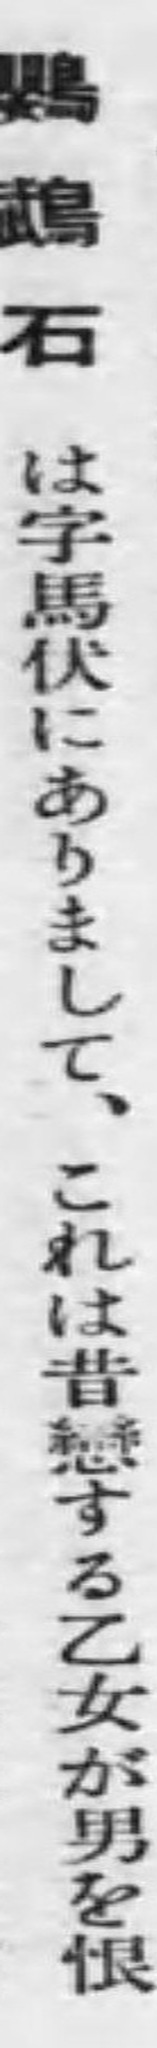鸚鵡石は字馬伏にありまして、これは昔恋する乙女が男を恨
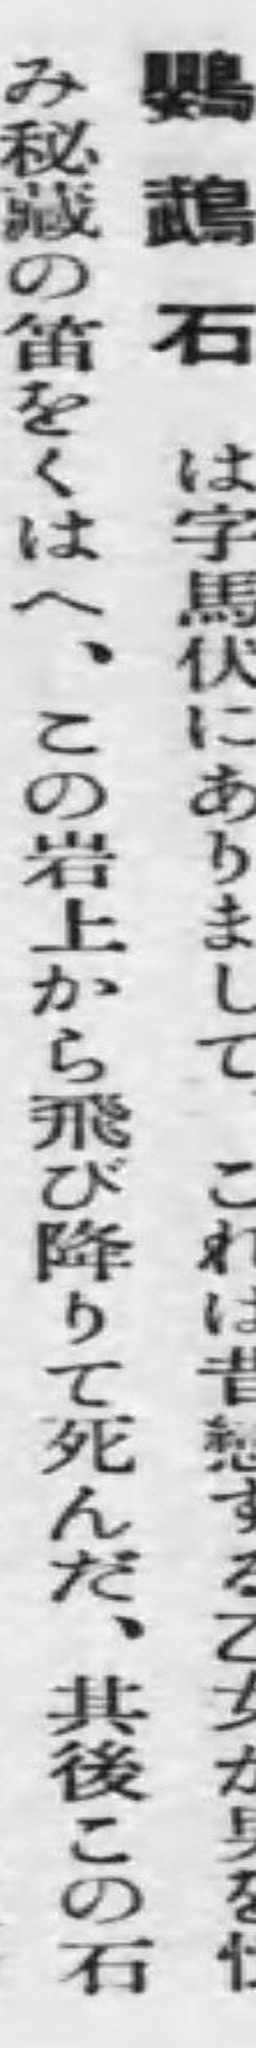み秘蔵の笛をくはへ、この岩上から飛び降りて死んだ、其後この石
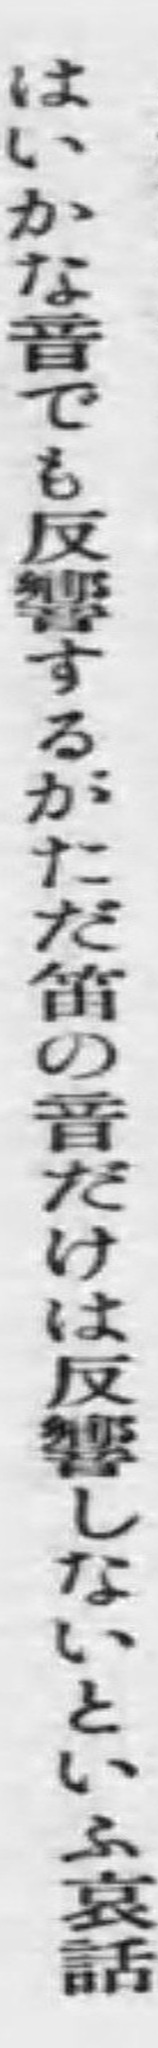はいかな音でも反響するがただ笛の音だけは反響しないといふ哀話
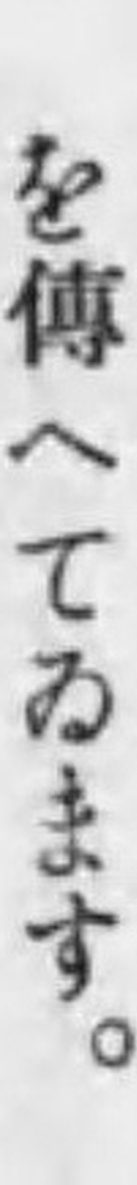を伝へてゐます。
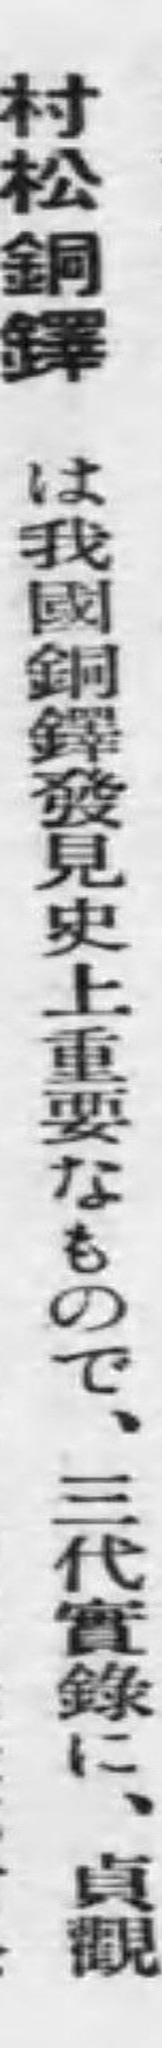村松銅鐸は我国銅鐸発見史上重要なもので、三代実録に、貞観
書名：東三河道中記 : 豊橋市及其附近案内
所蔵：国立国会図書館 National Diet Library, JAPAN
